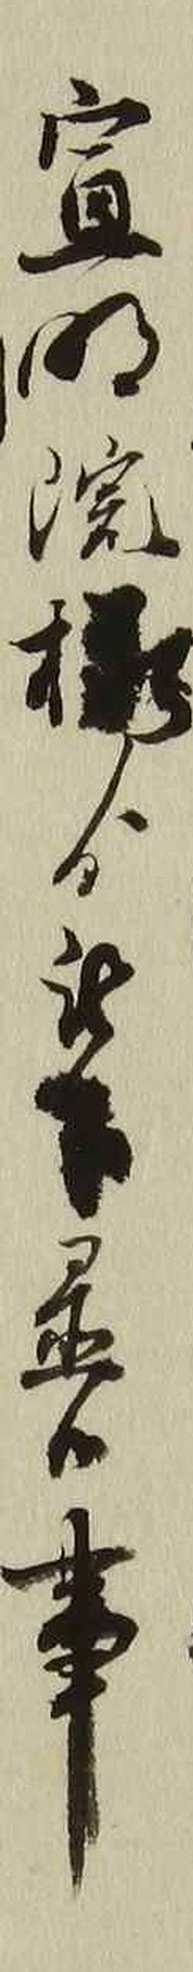宣明院概ゟ被下置候事
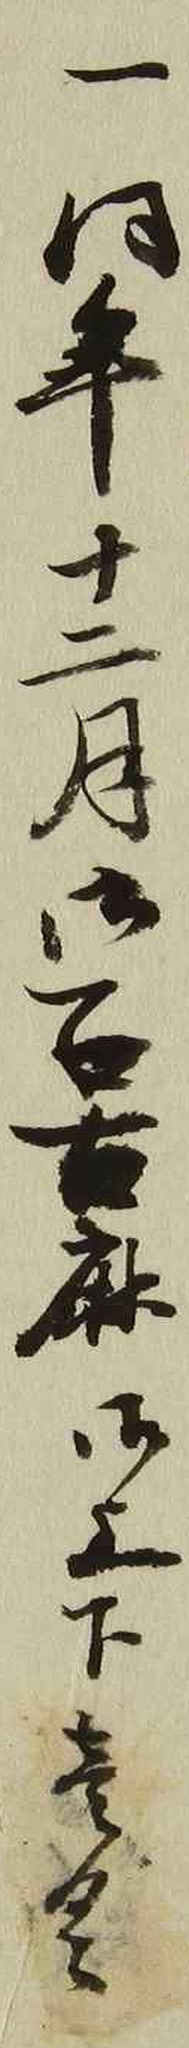一同年十二月御召古麻御上下壱具
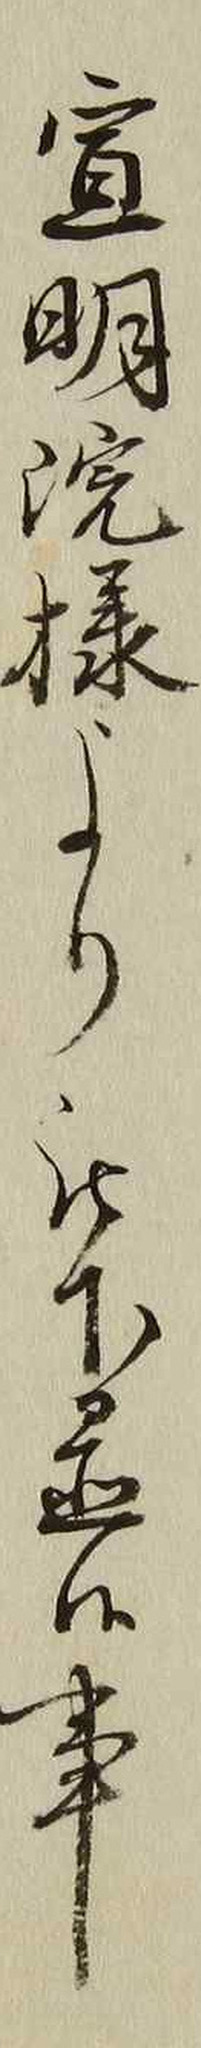宣明院様より被下置候事
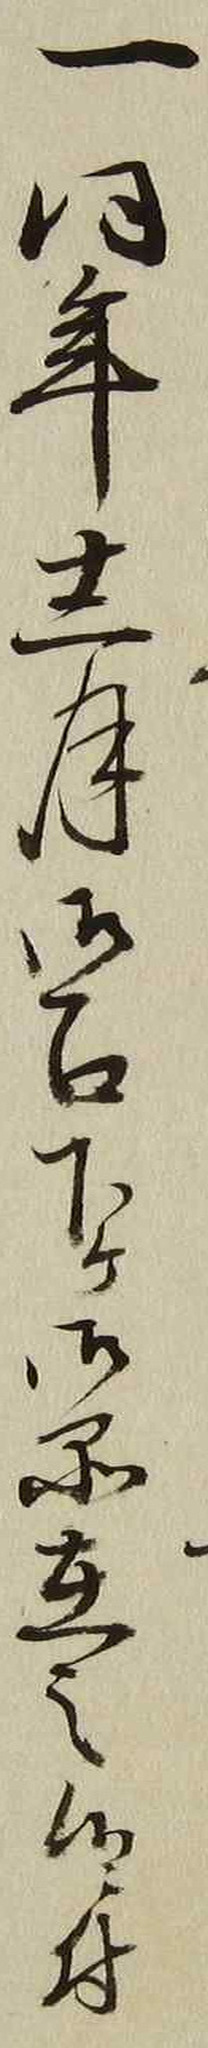一同年十二月御召下ケ御品在之候ニ付
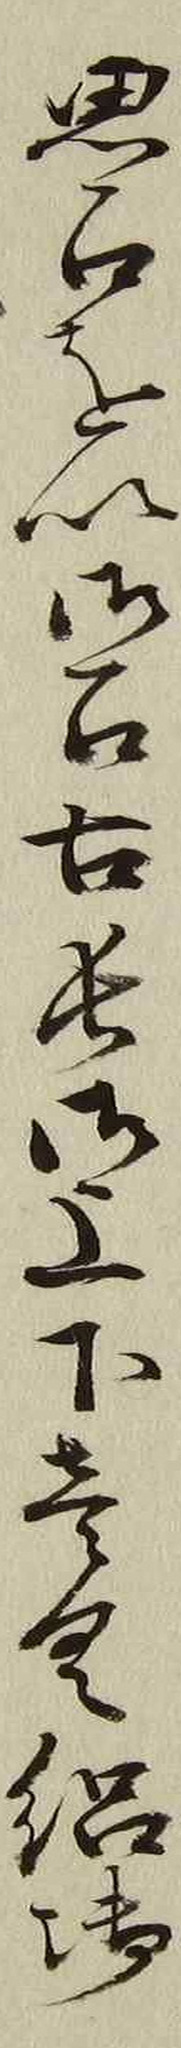思召を以御召古長御上下壱具絽御
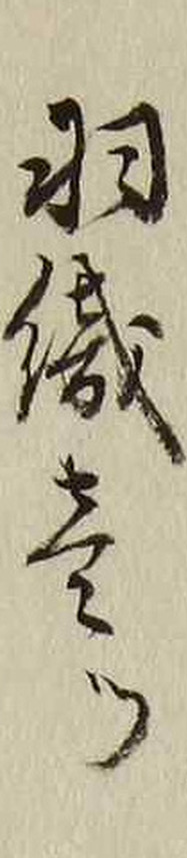羽織壱ツ
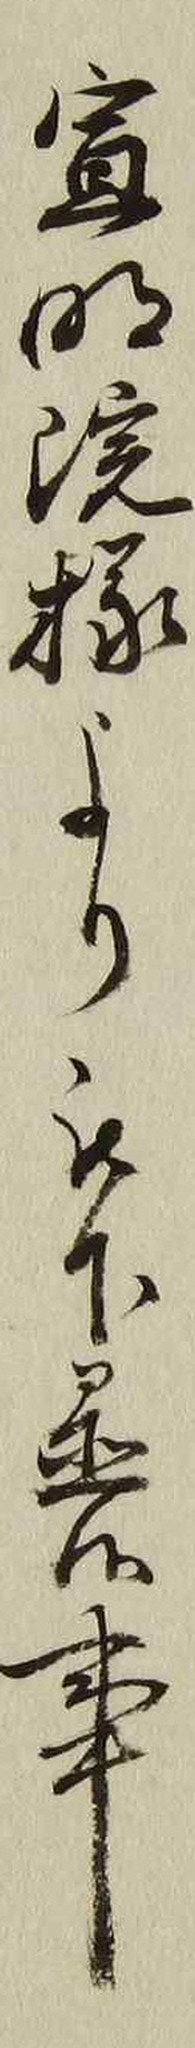宣明院様より被下置候事
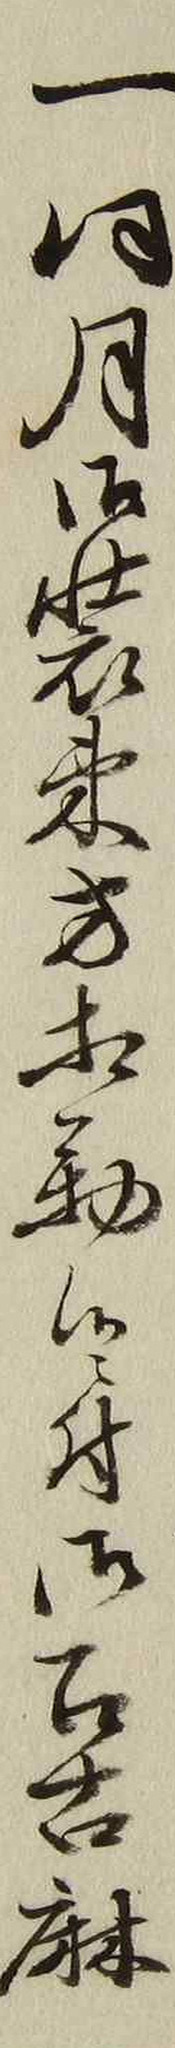一同月御装束方相勤候ニ付御召古麻
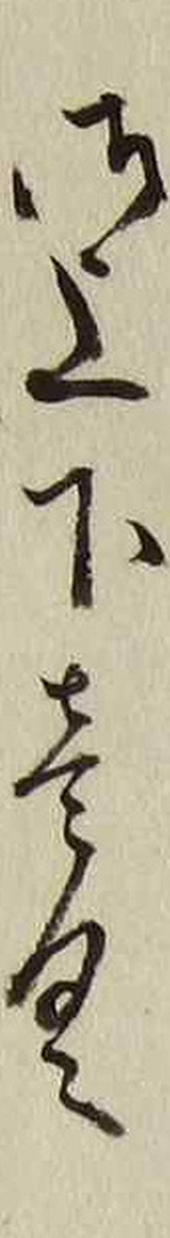御上下壱具
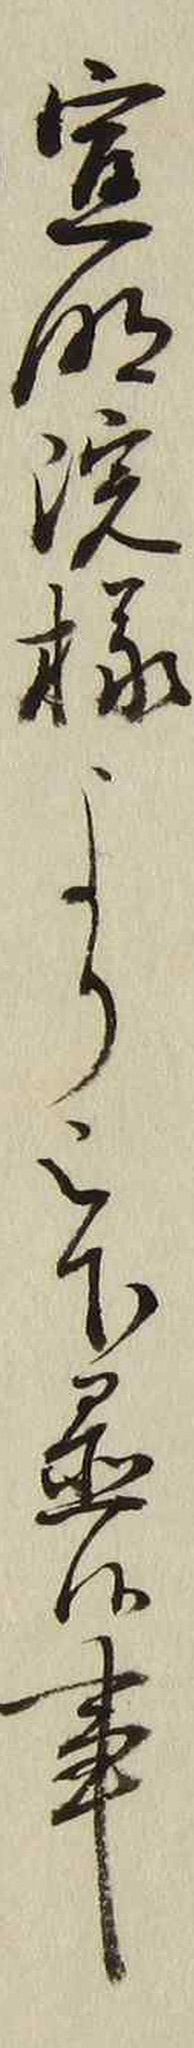宣明院様より被下置候事
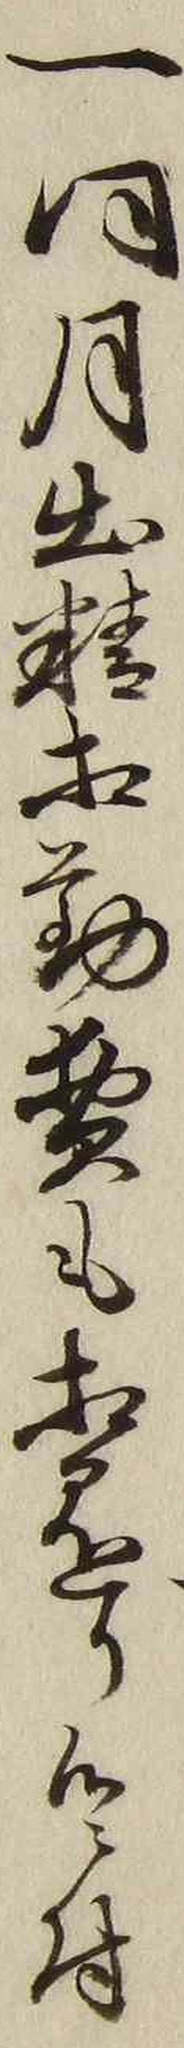一同月出精相勤費も相懸り候ニ付
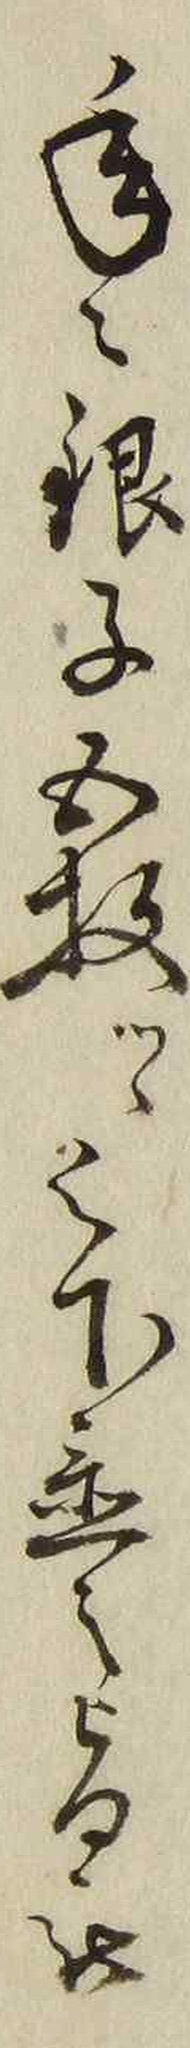年々銀子五枚ツヽ被下置之旨被

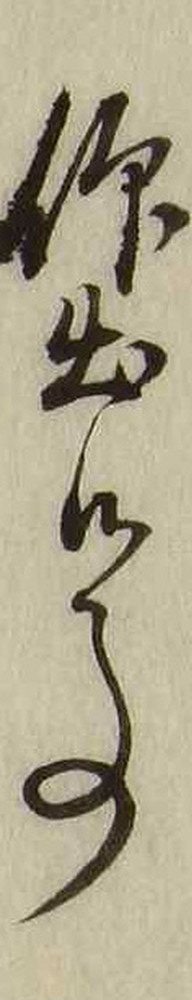仰出候事
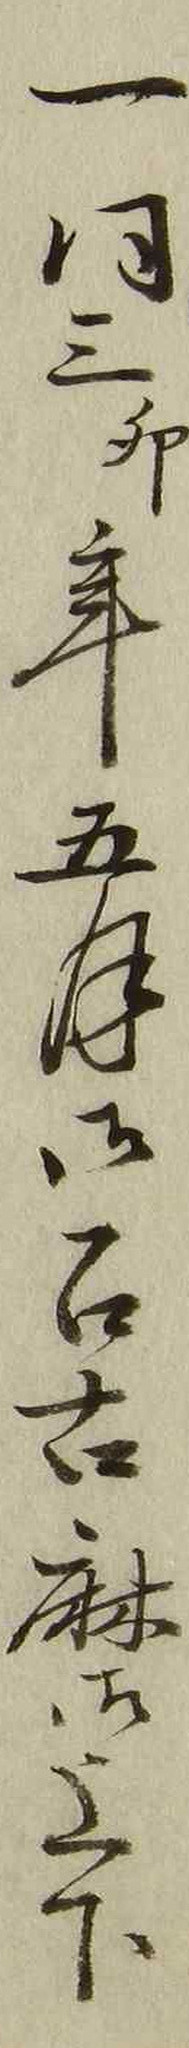一同三卯年五月御召古麻御上下
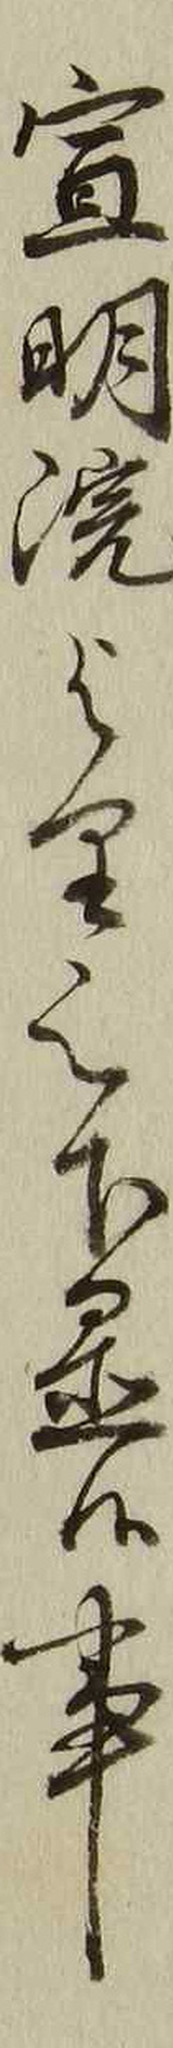宣明院より被下置候事
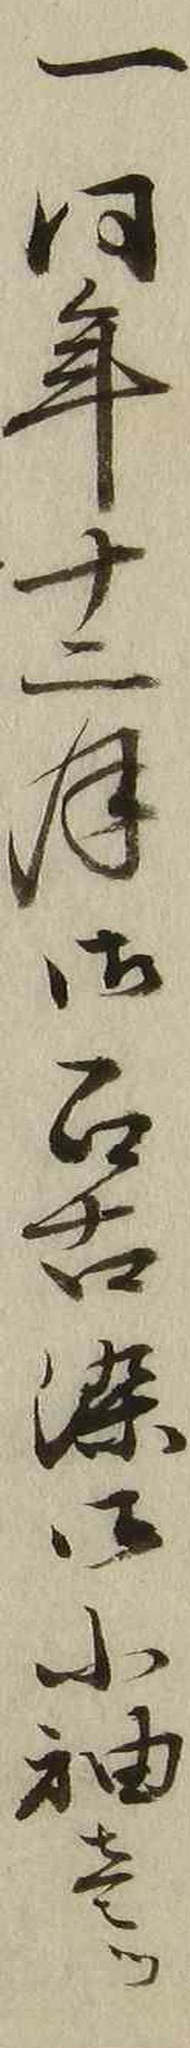一同年十二月御召古染御小袖壱ツ
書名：諸士系譜　巻之35　は之部3
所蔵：会津若松市立会津図書館
